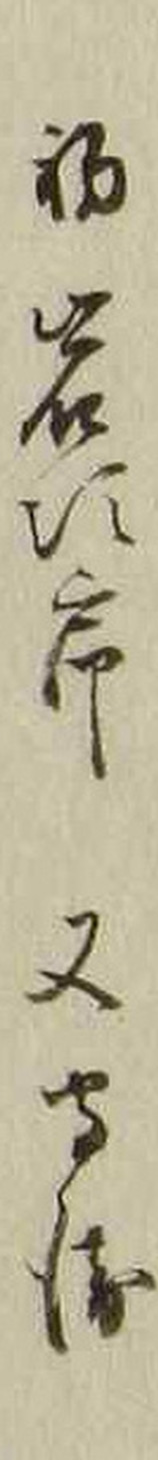初岩次郎又守勝
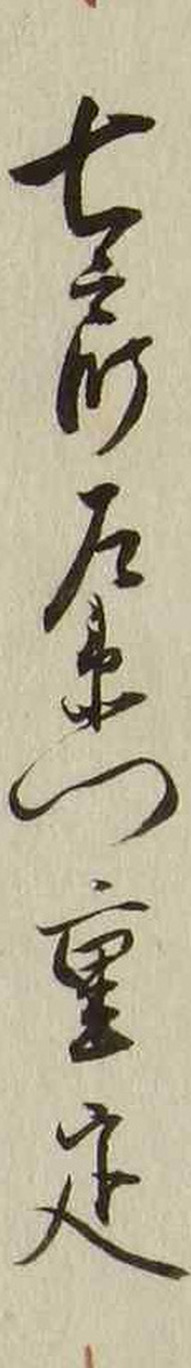七郎左衛門重定
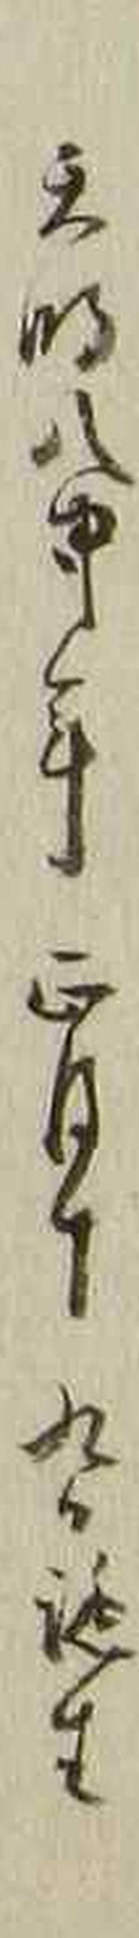天明八申年正月十九日誕生
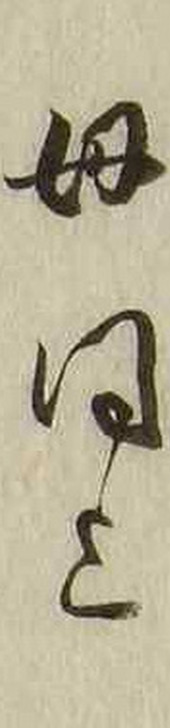母同上
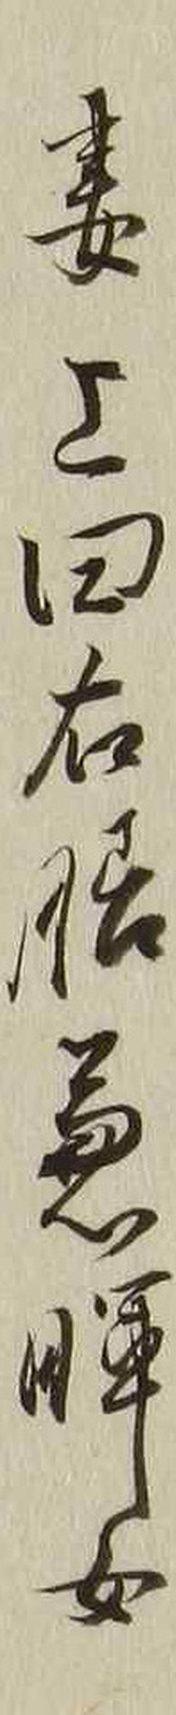妻上田右膳兼暉女
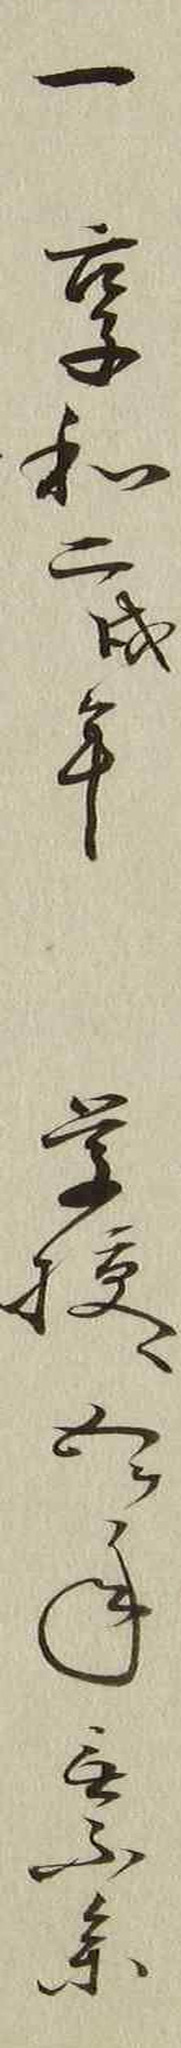一享和二戌年学校へ五ケ年不参無く
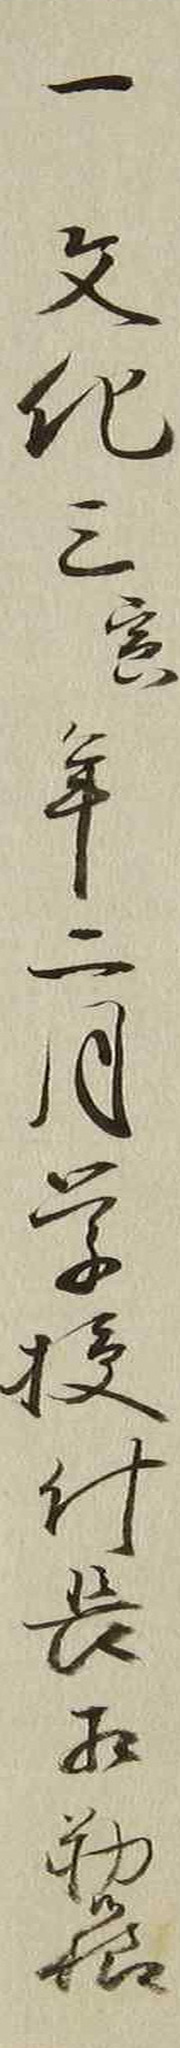一文化三寅年二月学校什長相勤め候様
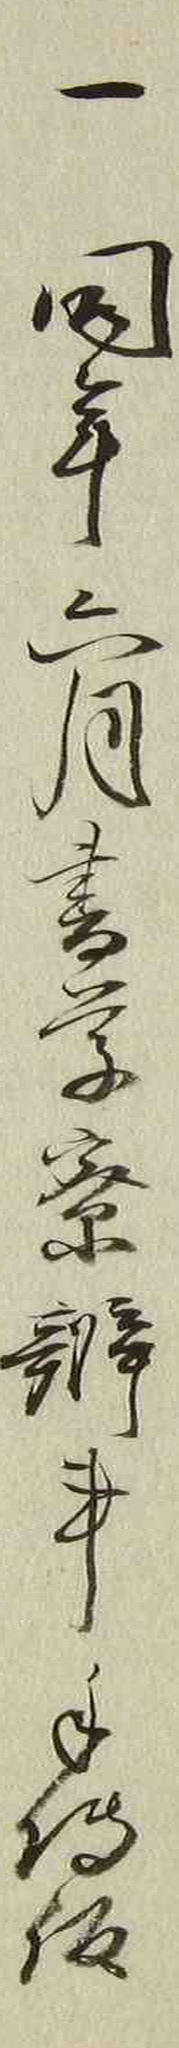一同年六月書学寮辨亊手伝い仮
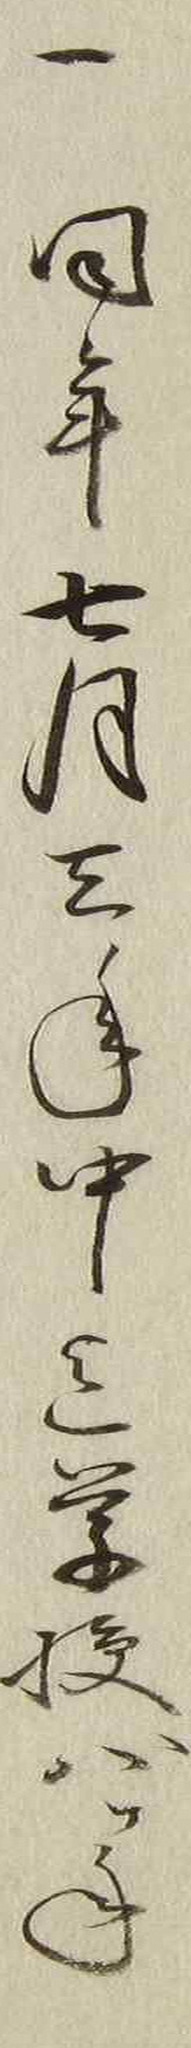一同年七月三年中迄学校へ八ケ年

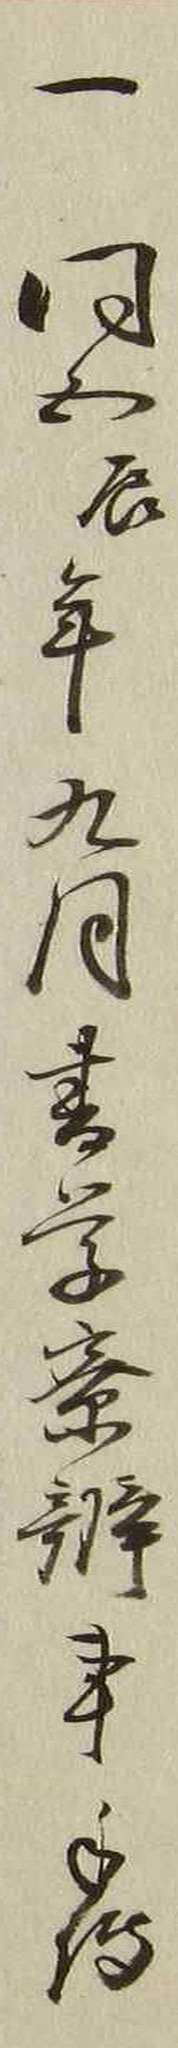一同五辰年九月書学寮辨亊手伝い
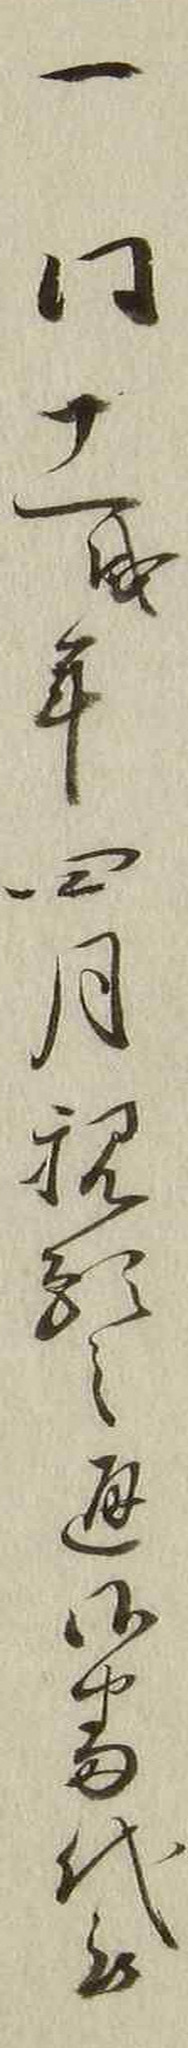一同十一戌年四月親願い之通り御番代
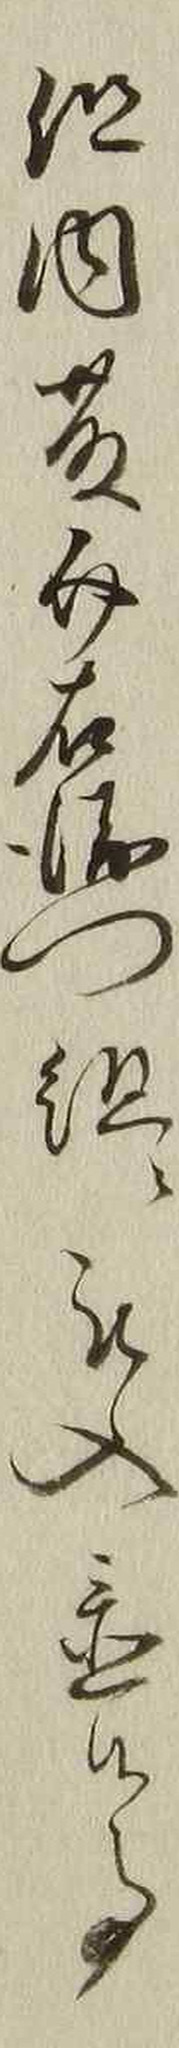但し内藤介右衛門組ニ入置かれ候事
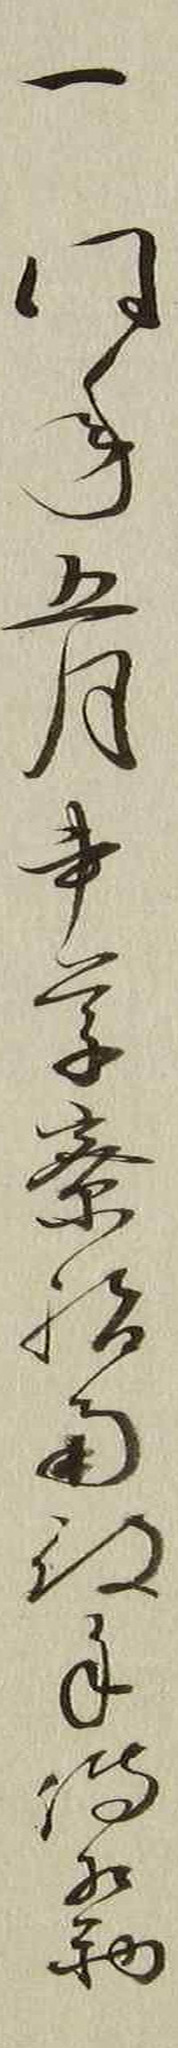一同年五月書学寮指南役手伝い相勤め
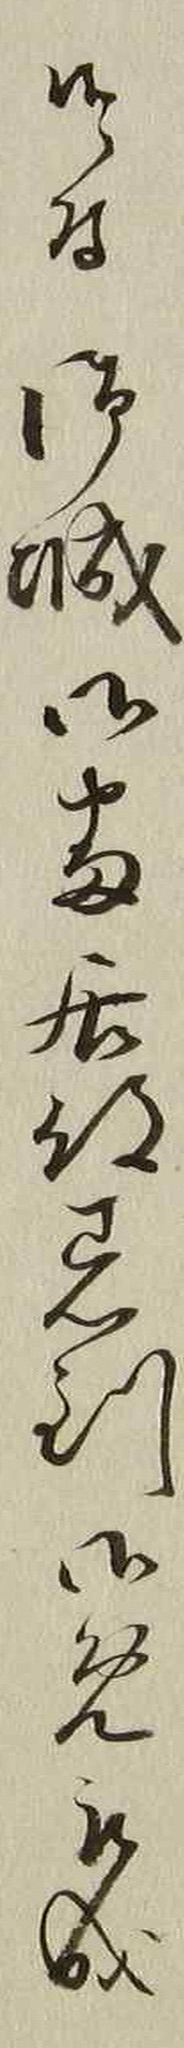候ニ付き御城御番居役着到御免成られ
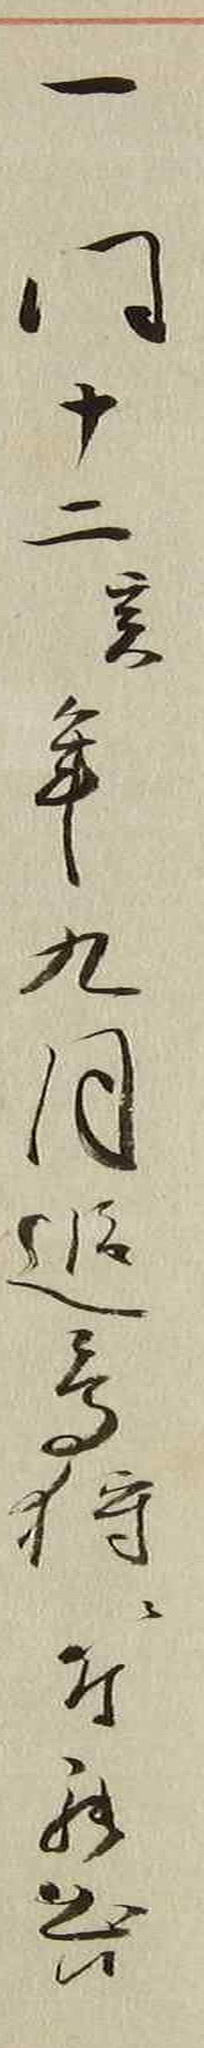一同十二亥年九月追鳥狩ニ付き罷り出で
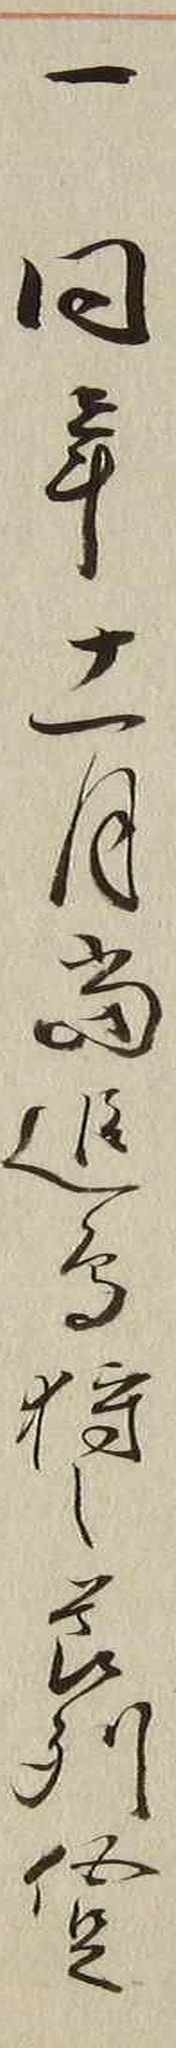一同年十一月当追鳥狩之節列伍足
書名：諸士系譜　巻之20　い之部20
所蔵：会津若松市立会津図書館
